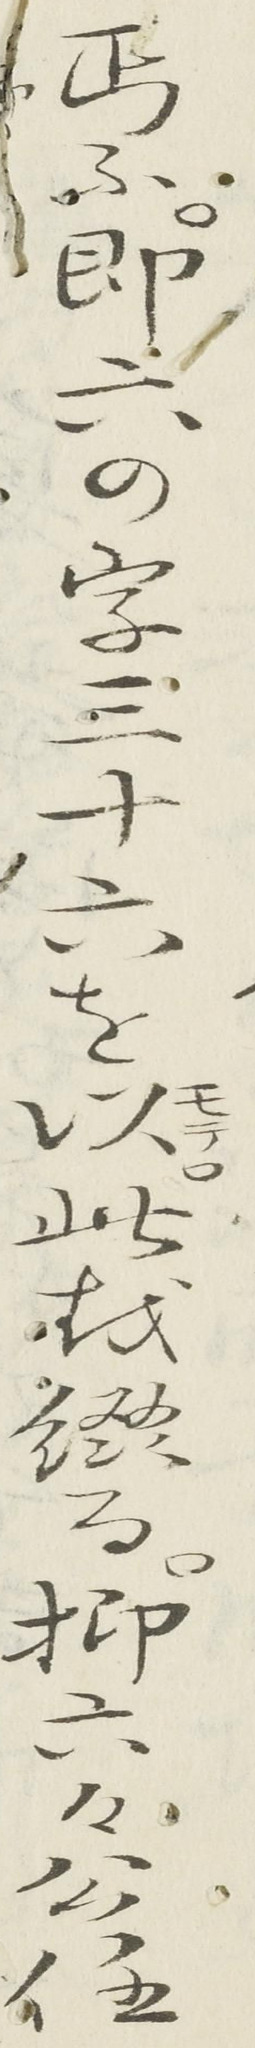丐ふ。即六の字三十六を以。此を綴る。抑六々公任
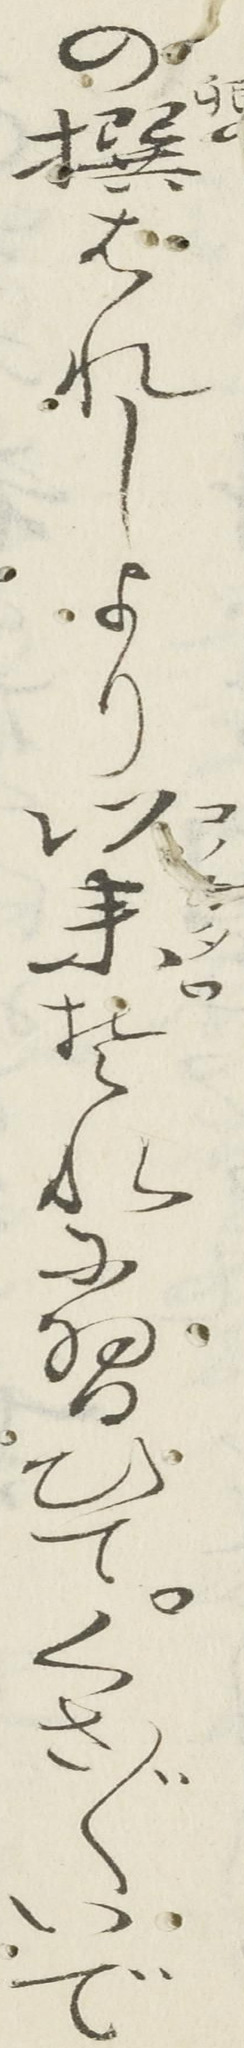の撰はれしより以来。それに習ひて、くさ〴〵いで
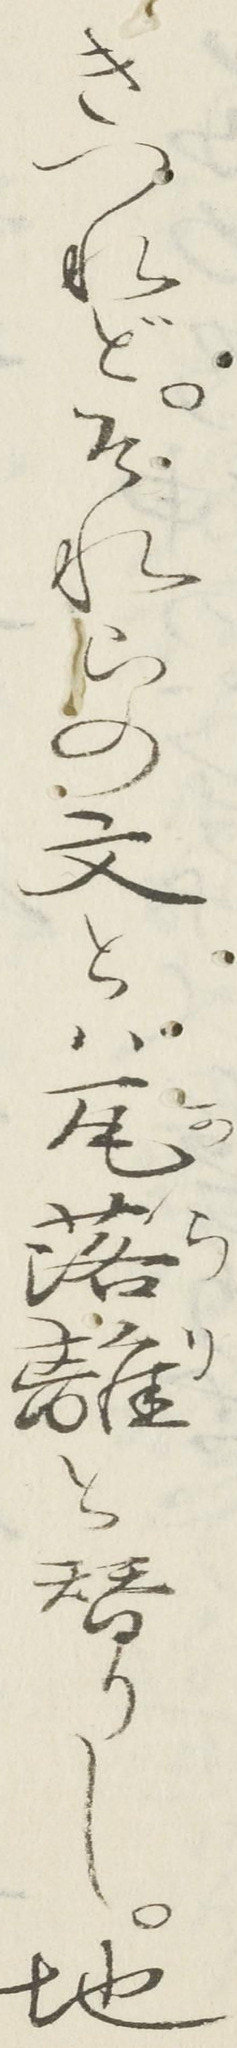きつれど。それらの文とハ瓦落離と替りし。地
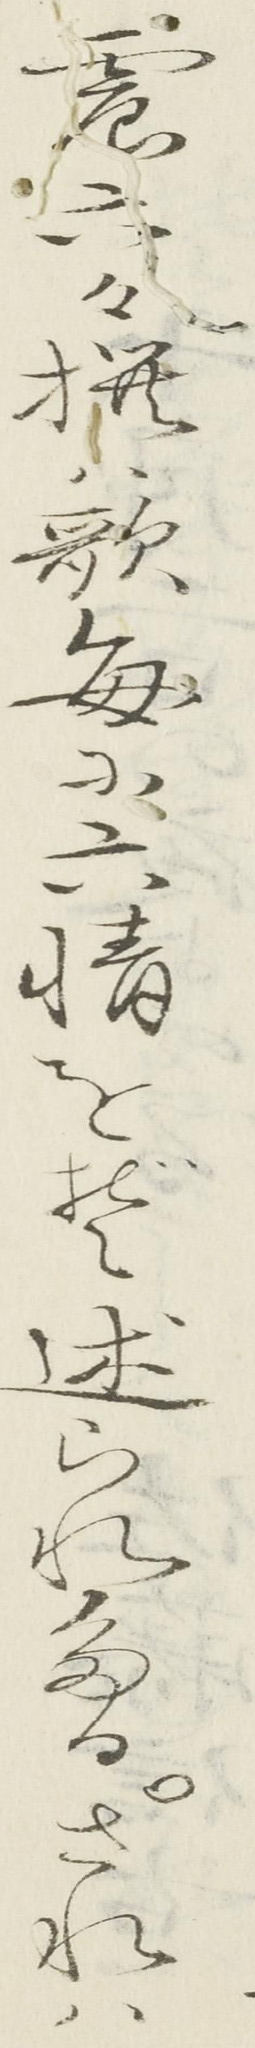震六々撰ハ歌毎に六情をぞ述られたるされハ
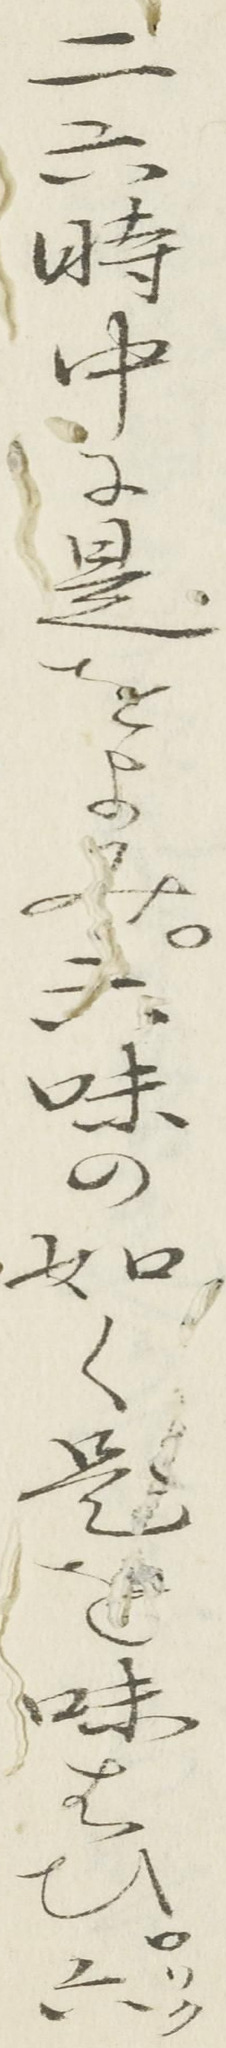二六時中に是をよみ六味の如く是を味はひ六リク
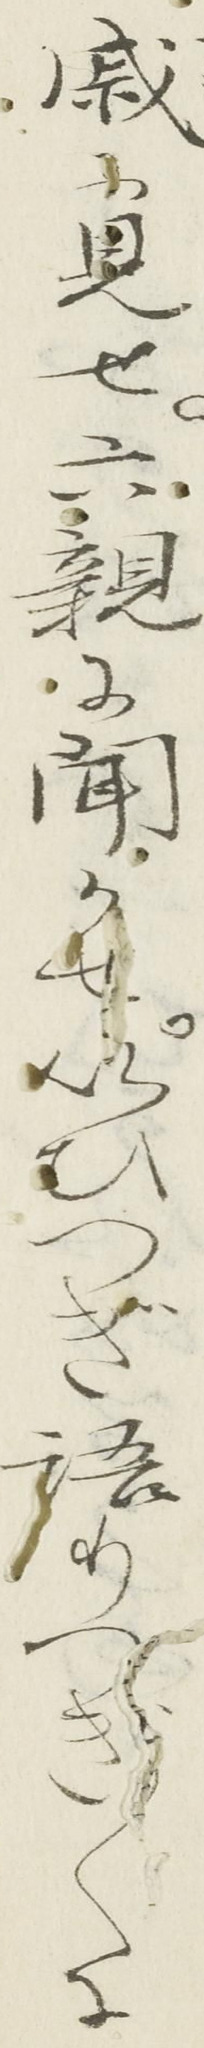戚に見せ六親に聞かせいひつぎ語りつき〳〵に
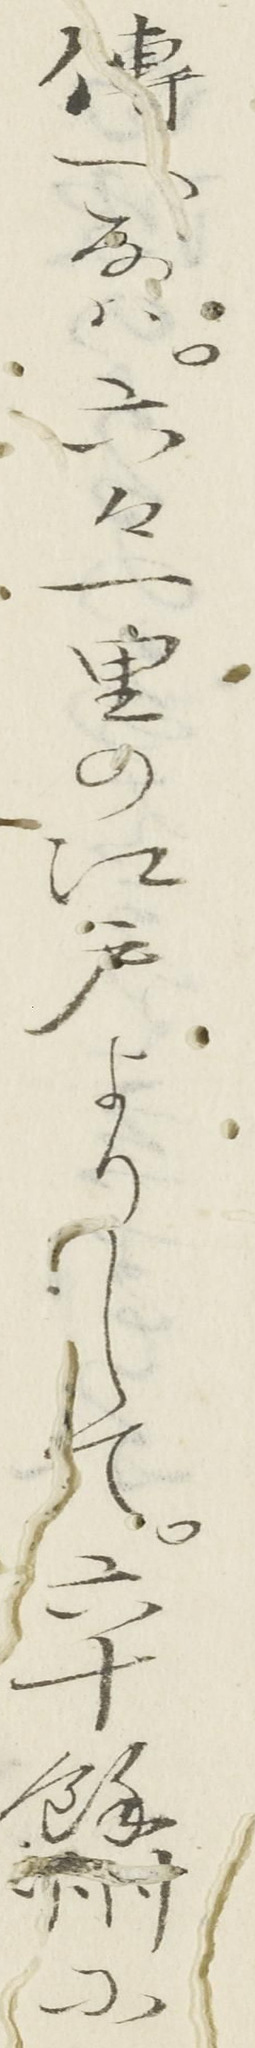伝へるハ六々一里の江戸よりして六十餘州に
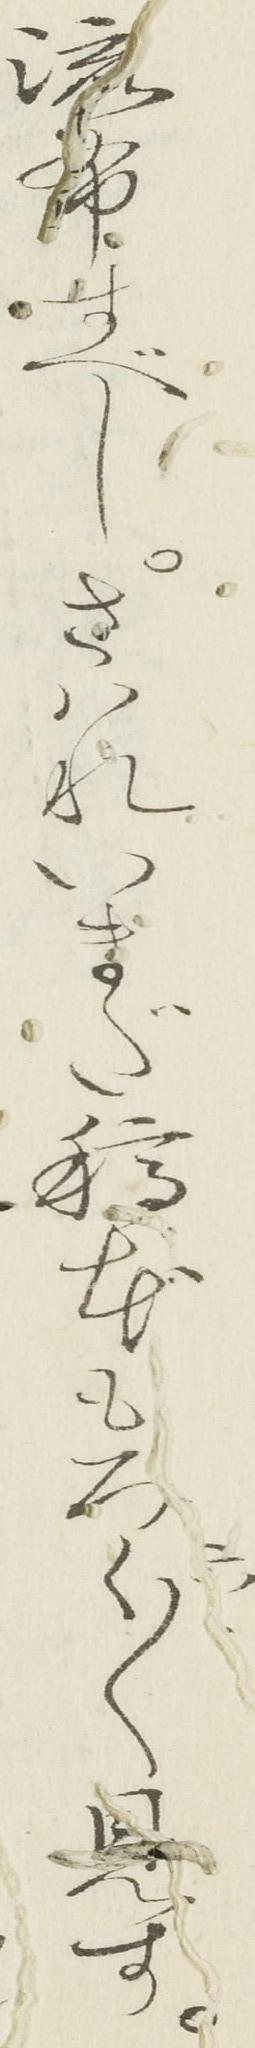流布すべしさハれいまだ稿本もろく〳〵見す
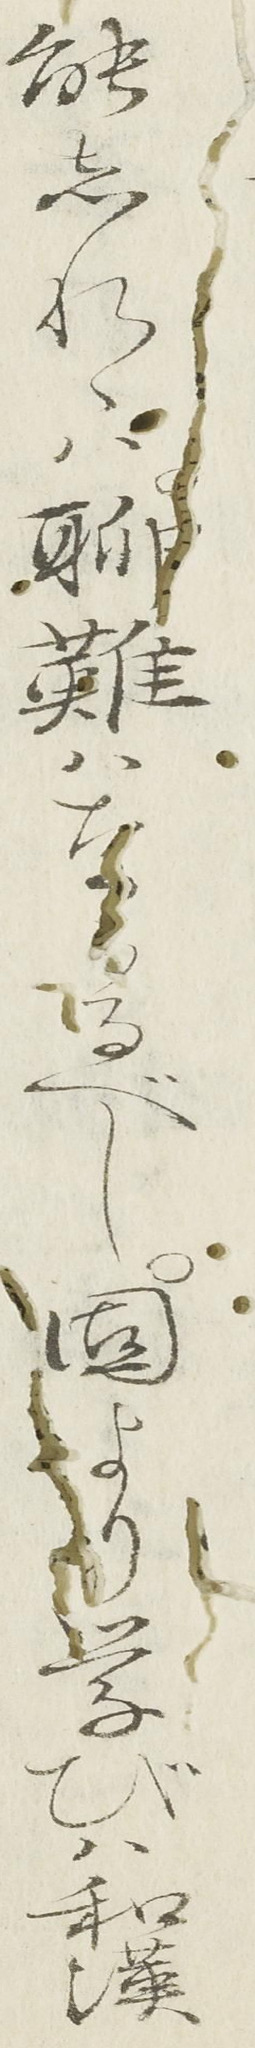能はれゝハ聊難ハなかるべし固より学びハ和漢
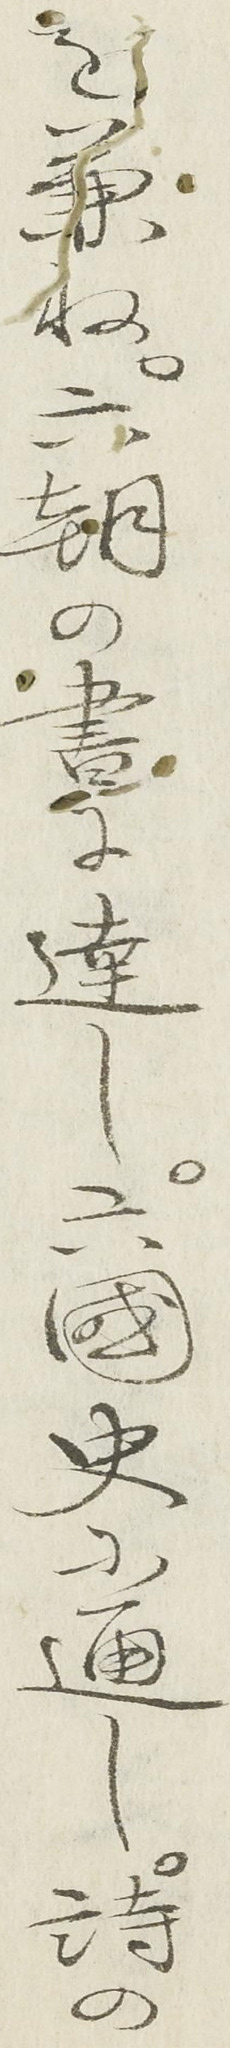を兼ね六朝の書に達し六国史に通し詩の
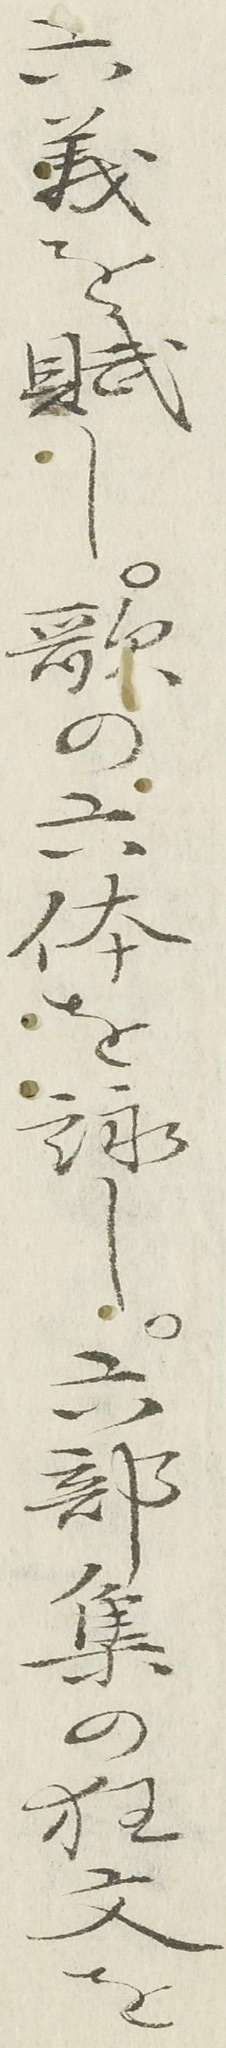六義を賦し歌の六体を詠し六部集の狂文を
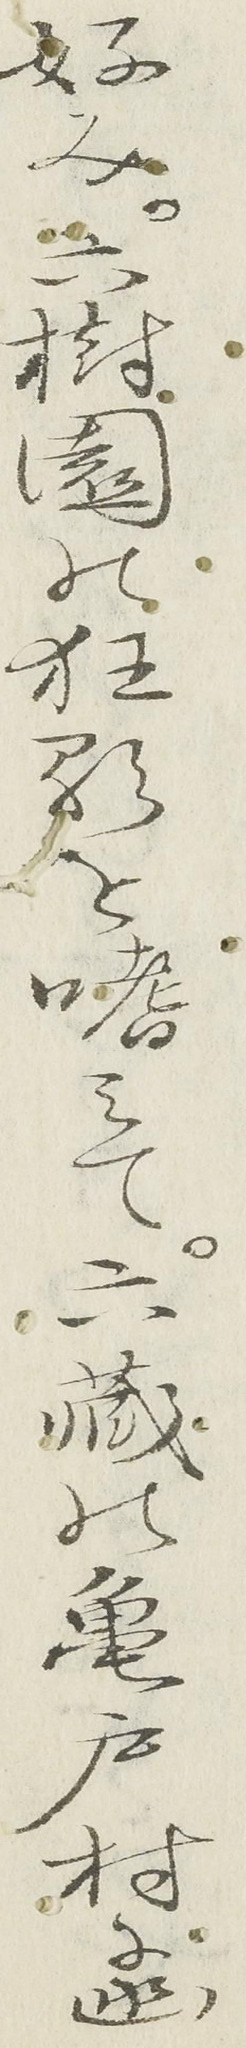好み六樹園の狂影を嗜みて六蔵の亀戸村に幽
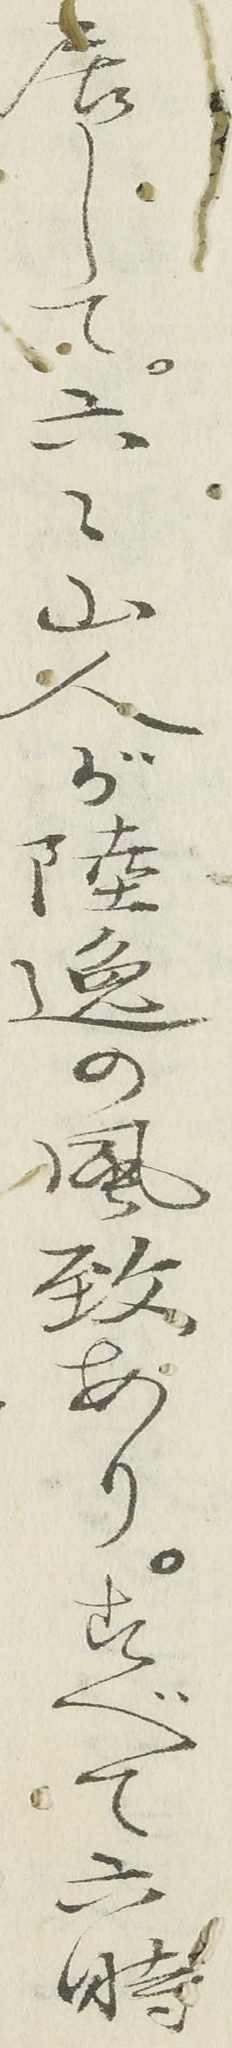居して六々山人が陸逸の風致ありすべて六時
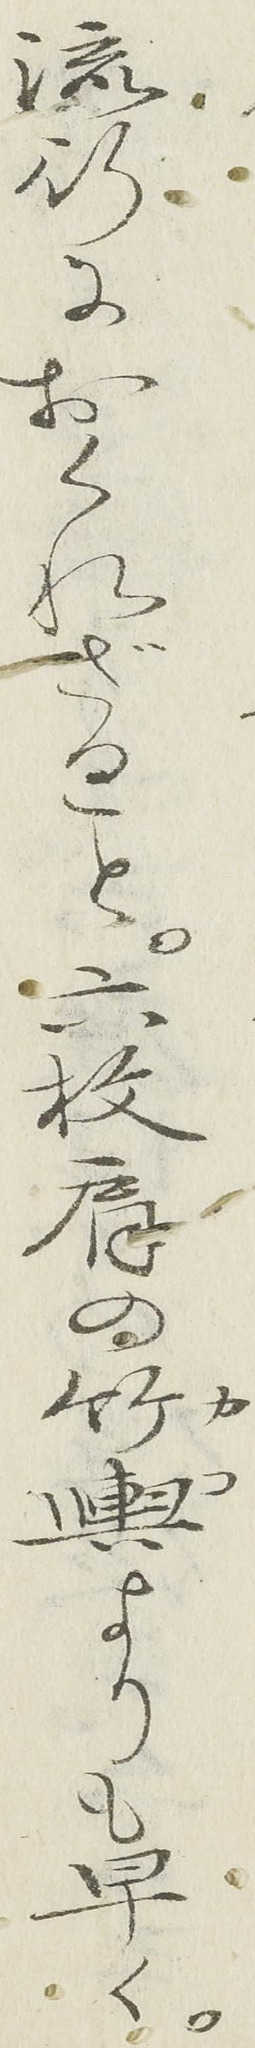流行におくれざること六枚肩の竹輿カコよりも早く
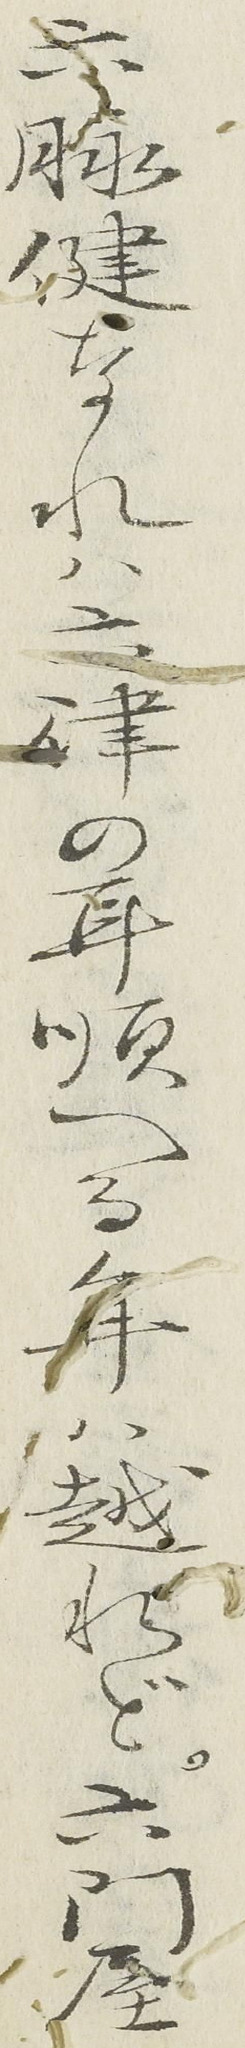六脉健なれハ六律の耳順へる年ハ越れど六門屋

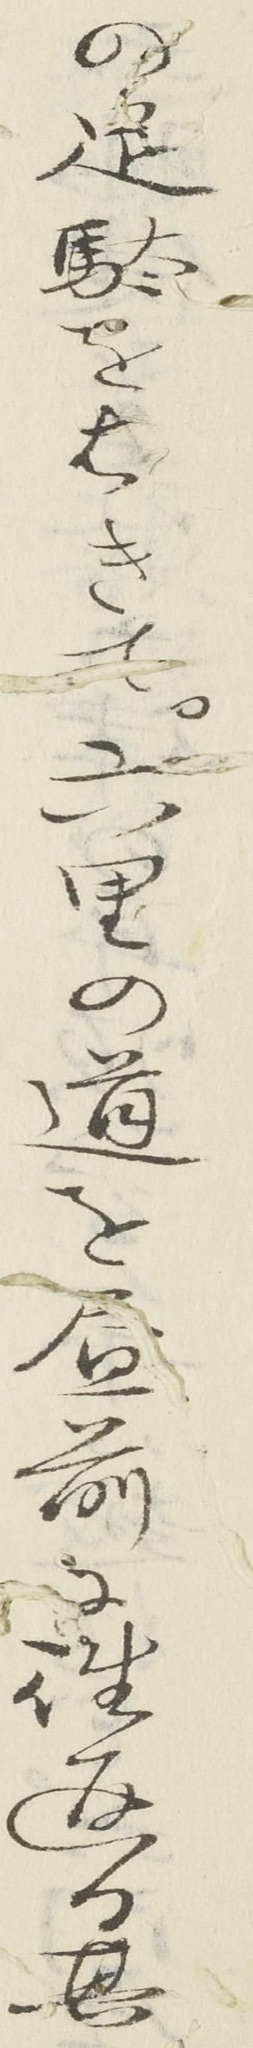の足駄をはきて。六里の道を昼前に往返る其
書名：地震考證　全
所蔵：東京大学地震研究所図書室 Earthquake Research Institute Library, The University of Tokyo, JAPAN
